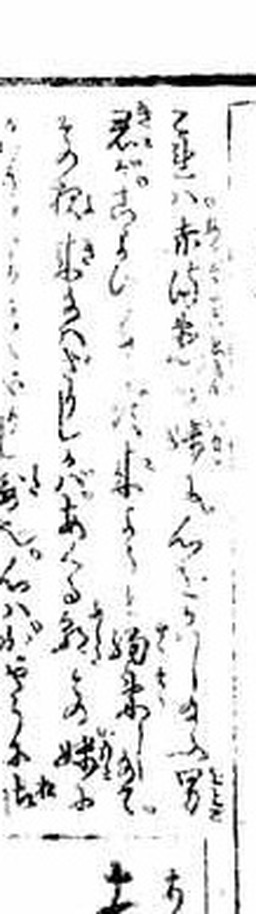君がこよひかならず来ようと約束して赤
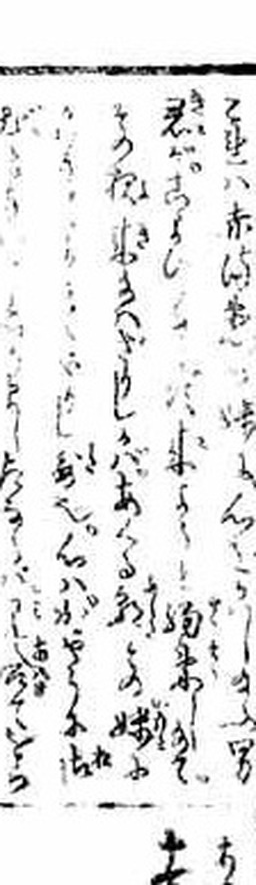その夜来給はざりしかばあくる朝その妹に
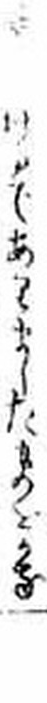けるでありましたものをとかな
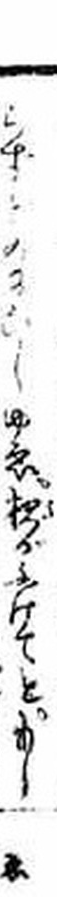らずとの給ひしゆゑ夜がふけてもし
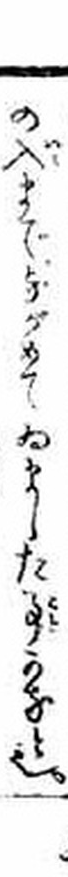の入までながめてゐました事かなと也
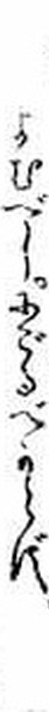よむべしにごるべからず

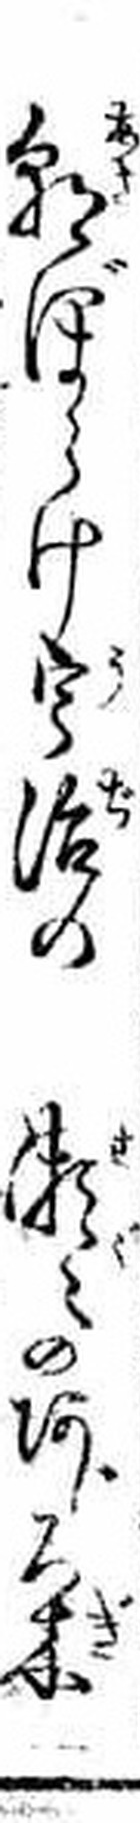朝ぼらけ宇治の瀬々のあじろ木
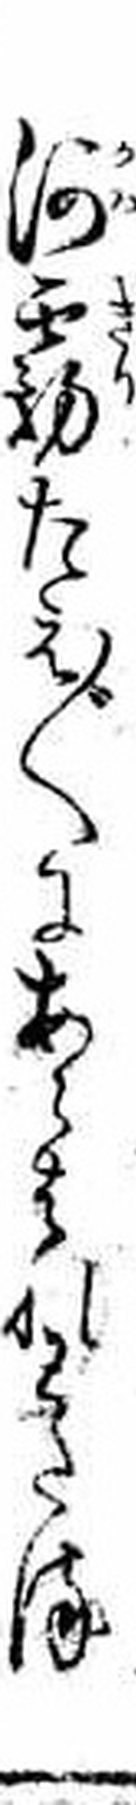河霧たえ〴〵にあらはれわたる
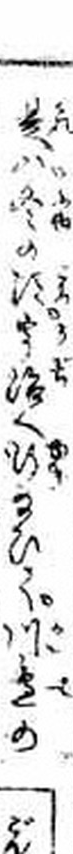是は冬の頃宇治へ行給ひて川辺の
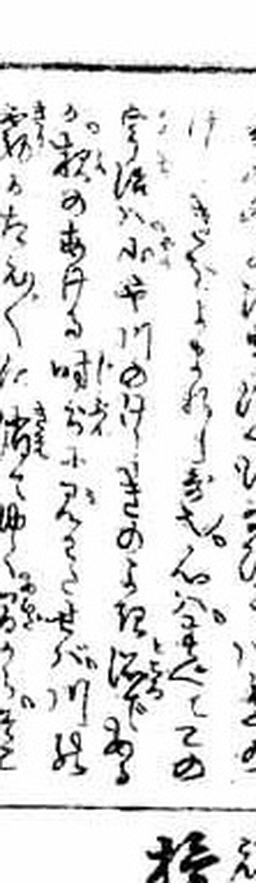宇治は山や川のけしきのよき所である
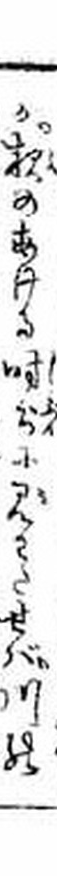か夜のあける時分に見わたせば川の
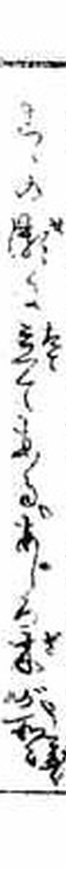こゝの瀬に立てあるあじろ木が霧
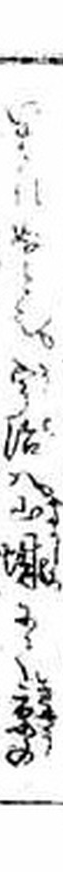いはれぬと也宇治は山城にて京の
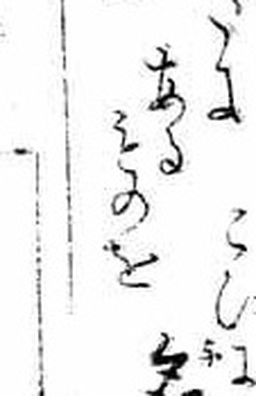もの也
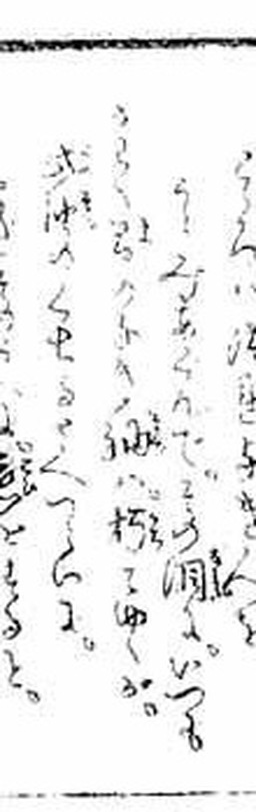かわく間のなき袖は朽てゆくが
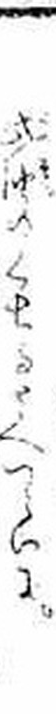此袖のくちるさへつらいに
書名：小倉百人一首
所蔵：東京学芸大学教育コンテンツアーカイブ
